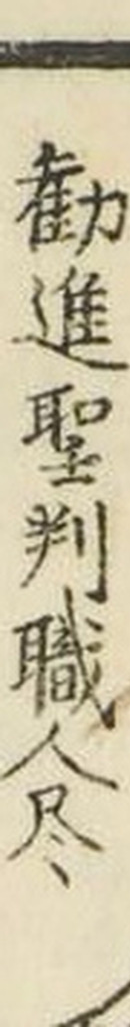勧進聖判職人尽
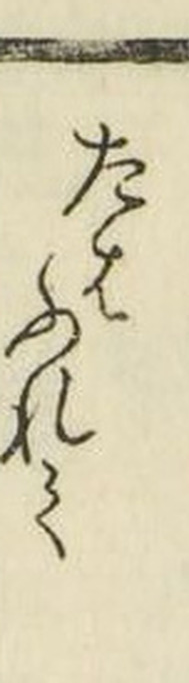たはふれて
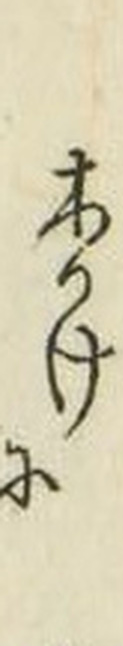木かけに
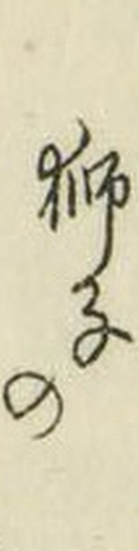獅子の
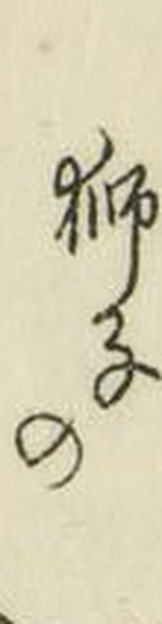獅子の
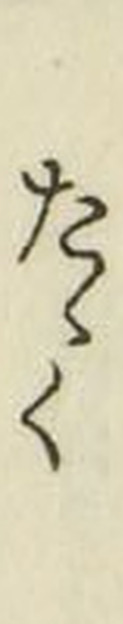たゝく
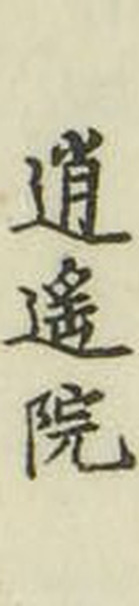逍遥院

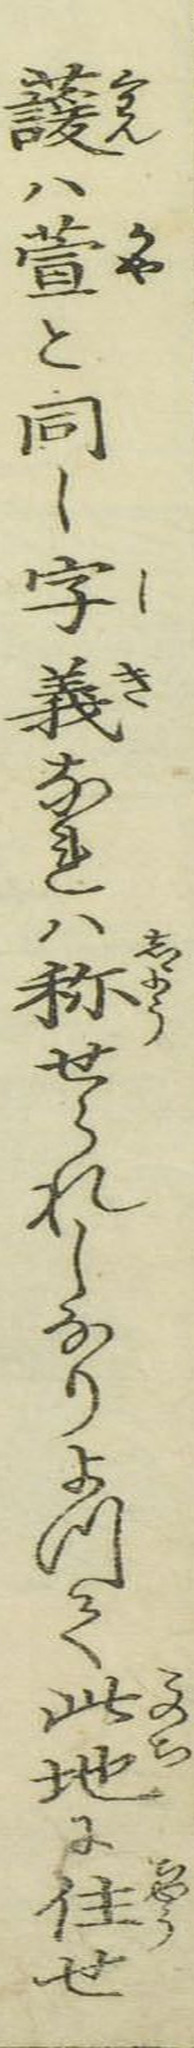蘐は萱と同し字義なれは称せられしなりよつて此地に住せ
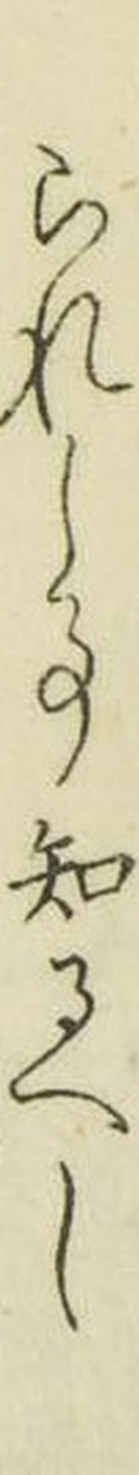られし事知るへし
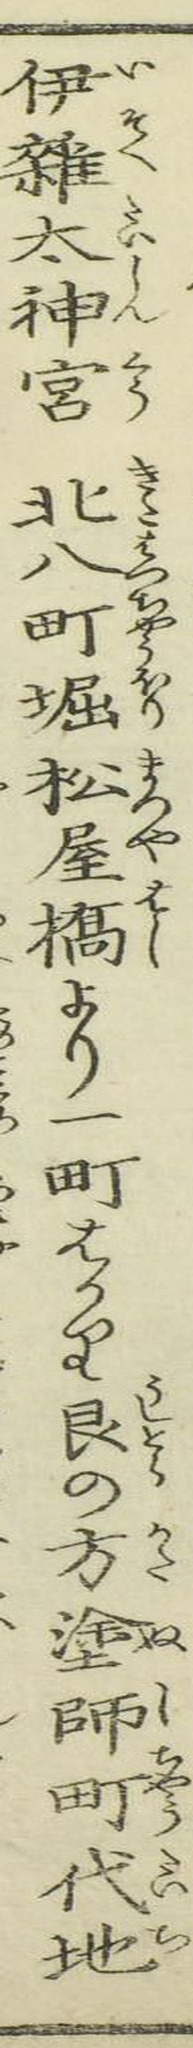伊雑太神宮北八町堀松屋橋より一町はかり艮の方塗師町代地
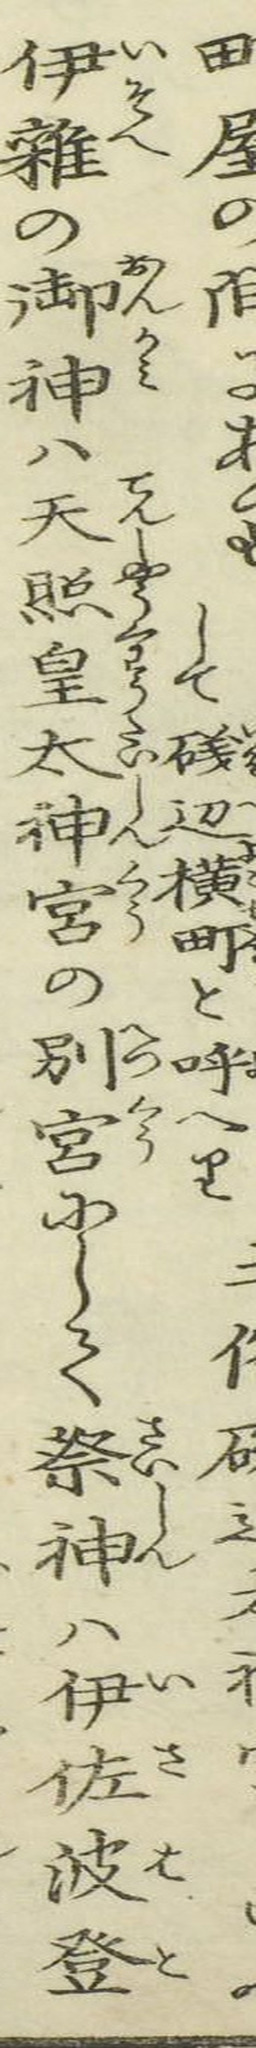伊雑の御神は天照皇太子神宮の別宮にして祭神は伊佐波登
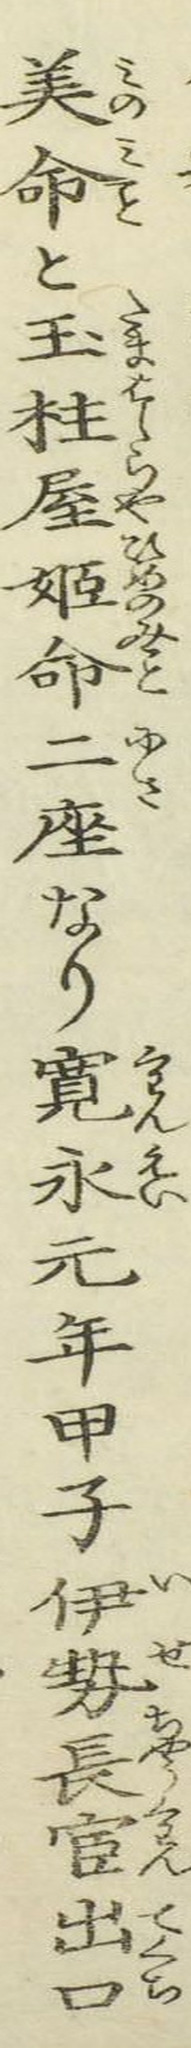美命と玉柱屋姫命二座なり寛永元年甲子伊勢長官出口
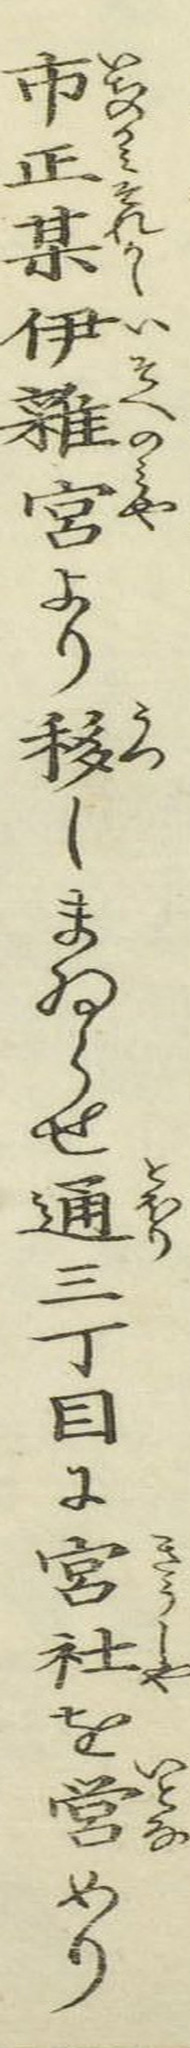市正某伊雑宮より移しまゐらせ通三丁目に宮社を営めり
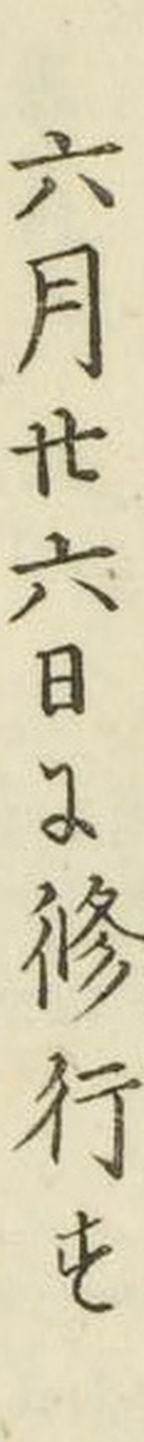六月廿六日に修行す
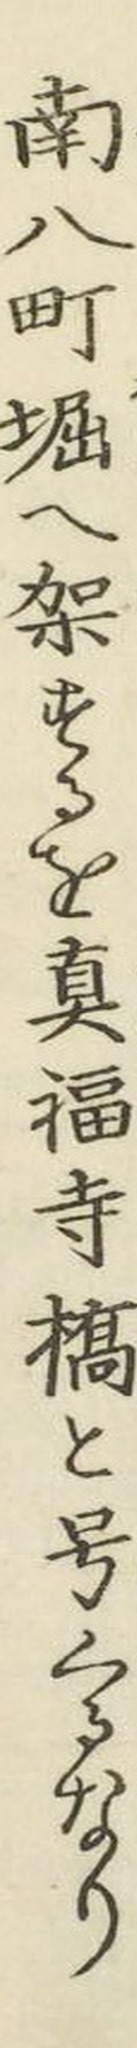南八町堀へ架するを真福寺橋と号くるなり
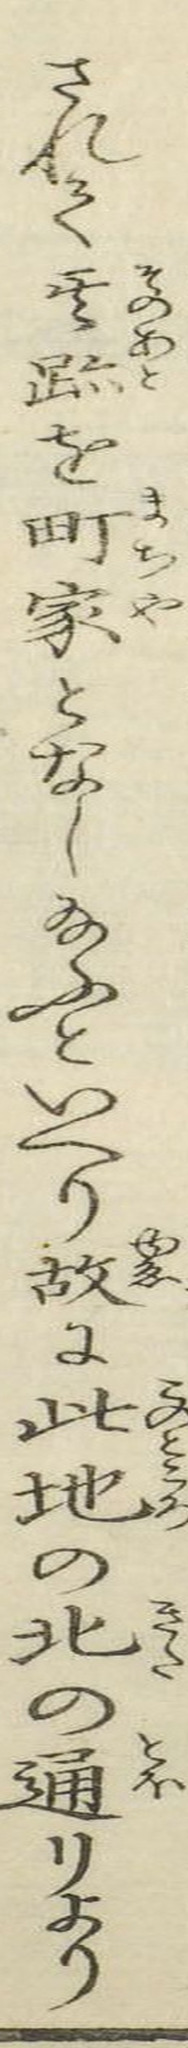されて其跡を町家となし給ふといへり故に此地の北の通りより
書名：江戸名所図会 20巻 巻之2
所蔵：東京学芸大学教育コンテンツアーカイブ
